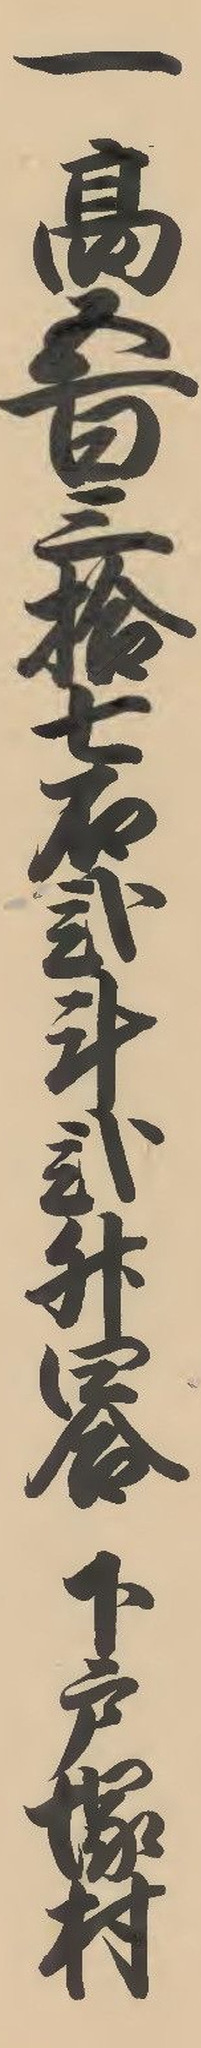一髙五百三拾七石弐斗弐升四合下戸塚村
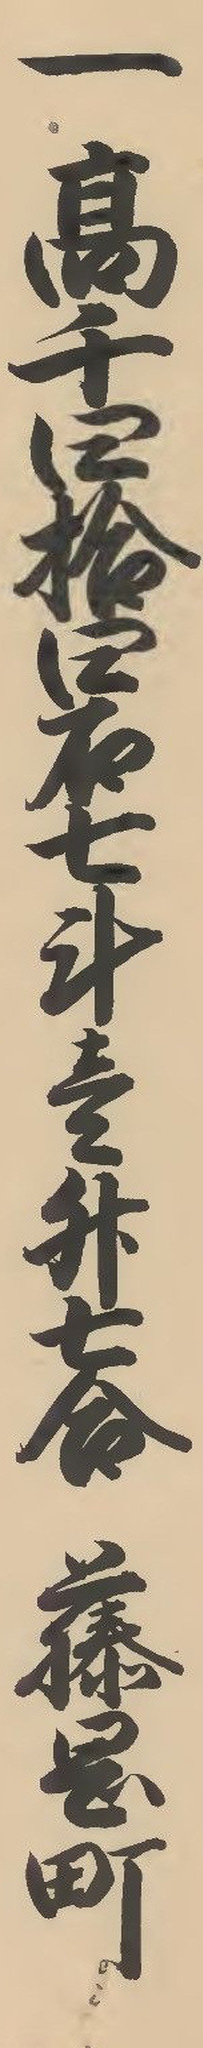一髙千四拾四石七斗壱升七合藤岡町
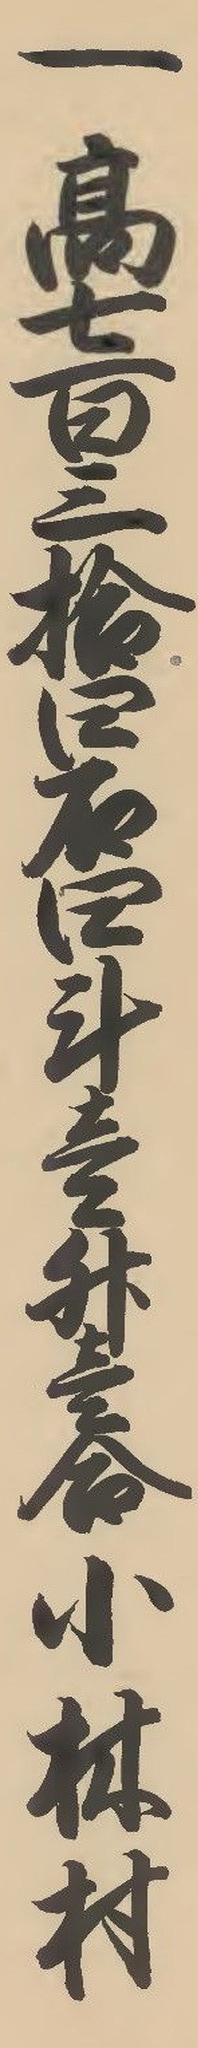一髙七百三拾四石四斗壱升壱合小林村
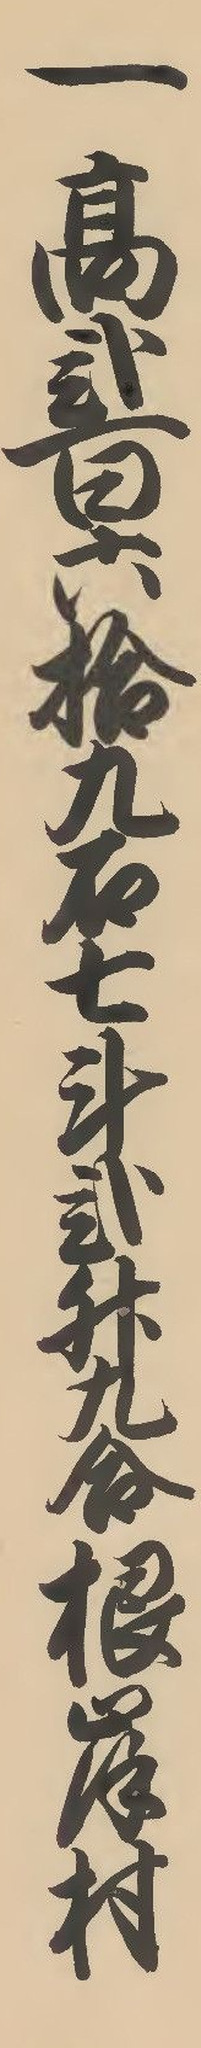一髙弐百六拾九石七斗弐升九合根岸村

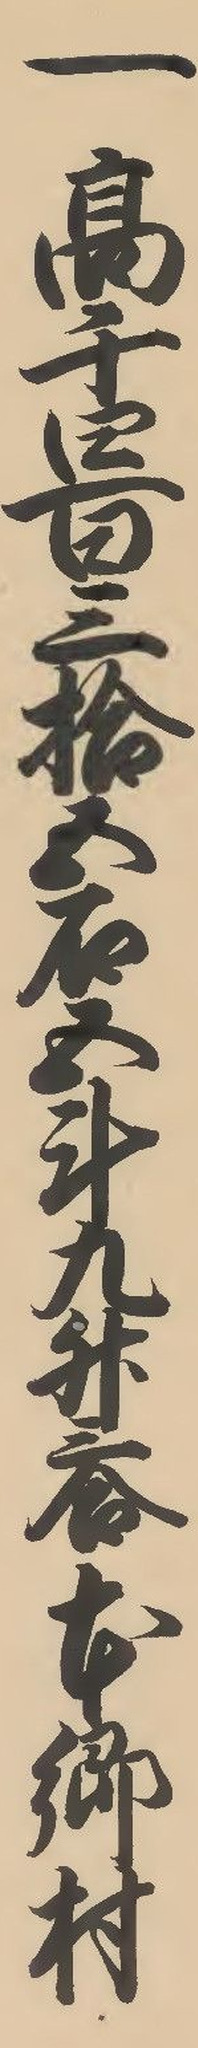一髙千四百三拾五石五斗九升三合本郷村
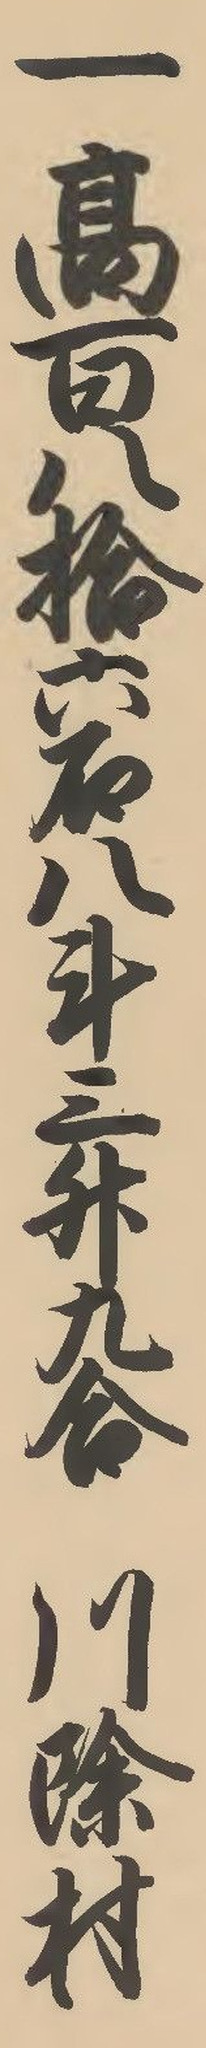一髙百八拾六石八斗三升九合川除村
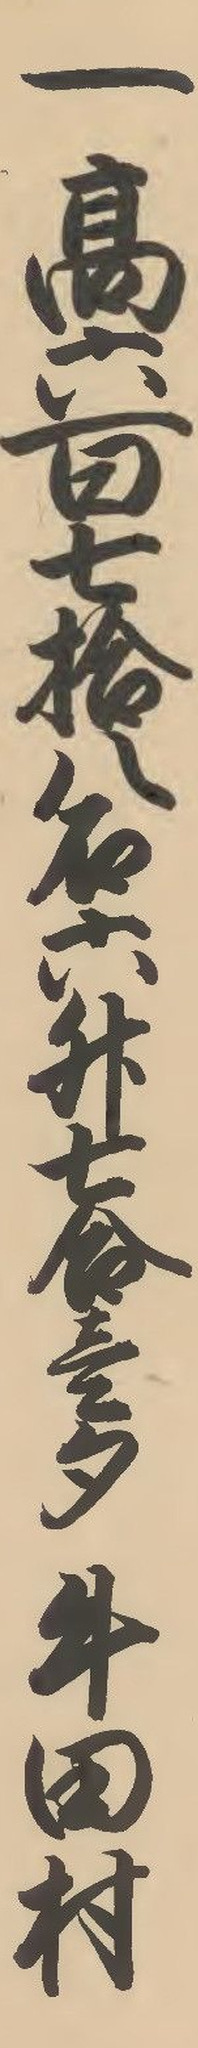一髙六百七拾八石六升七合壱夕牛田村
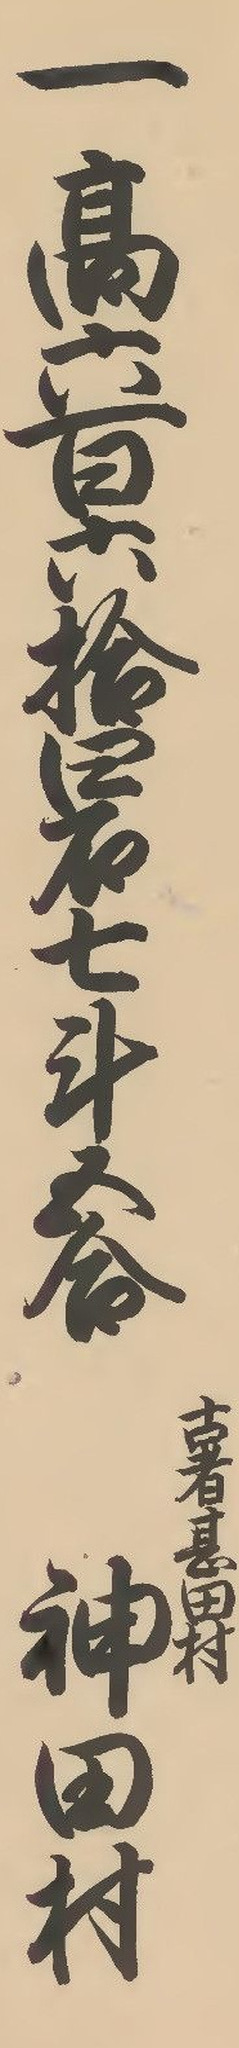一髙六百六拾四石七斗五合神田村
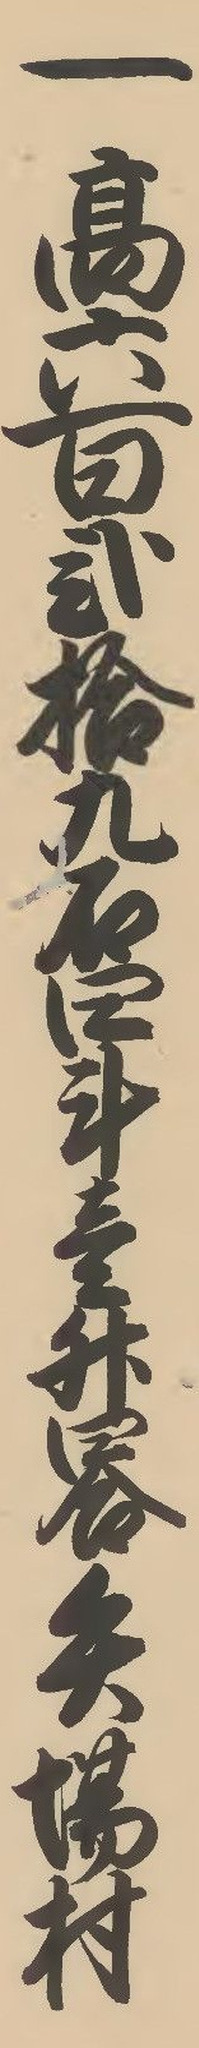一髙六百弐拾九石四斗壱升四合矢場村
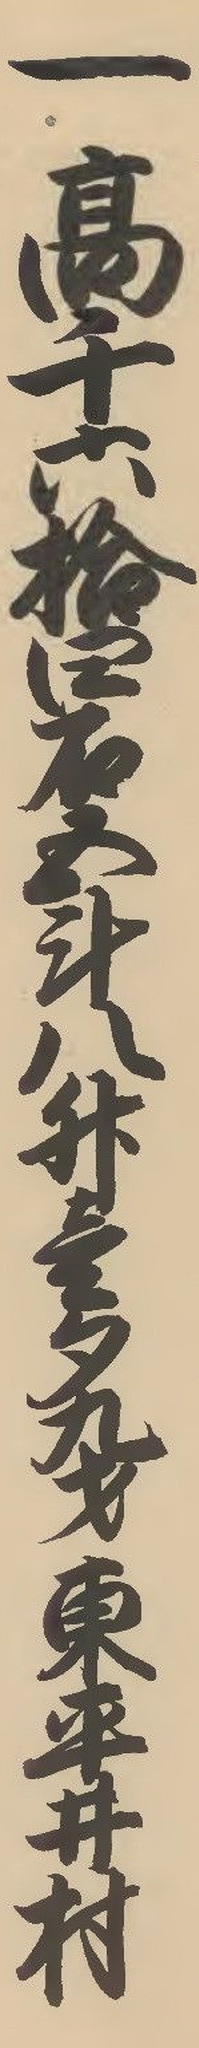一髙千六拾四石五斗八升壱夕九才東平井村
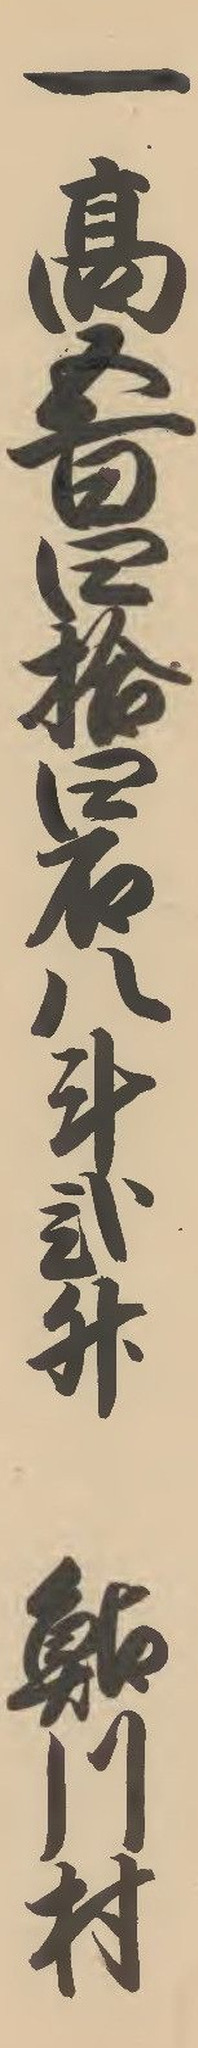一髙五百四拾四石八斗弐升鮎川村
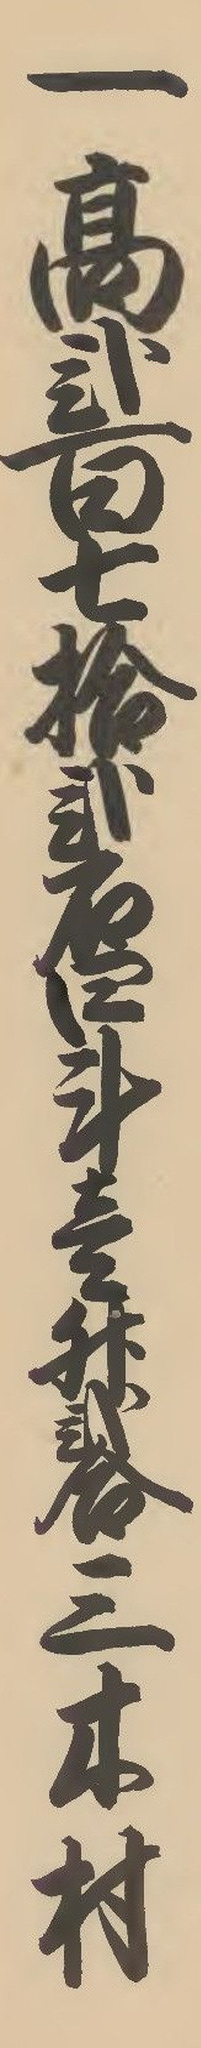一髙弐百七拾弐石四斗壱升弐合三木村

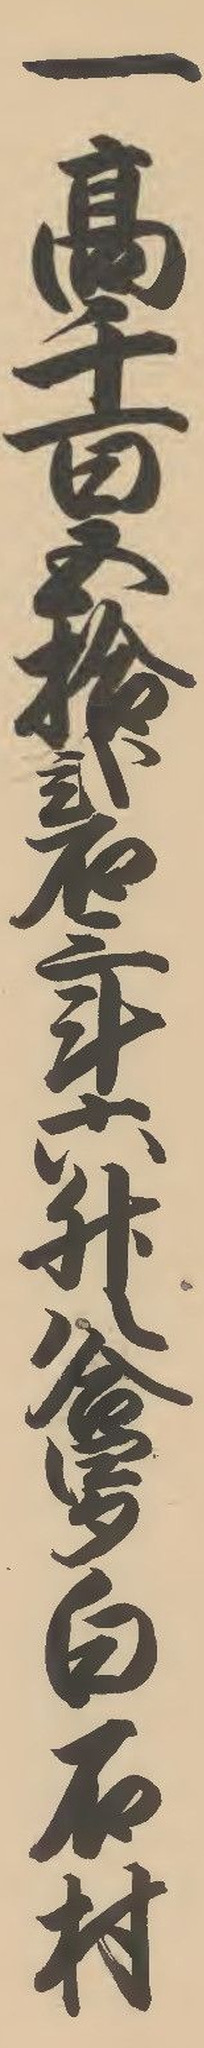一髙千百五拾弐石三斗六升八合四夕白石村
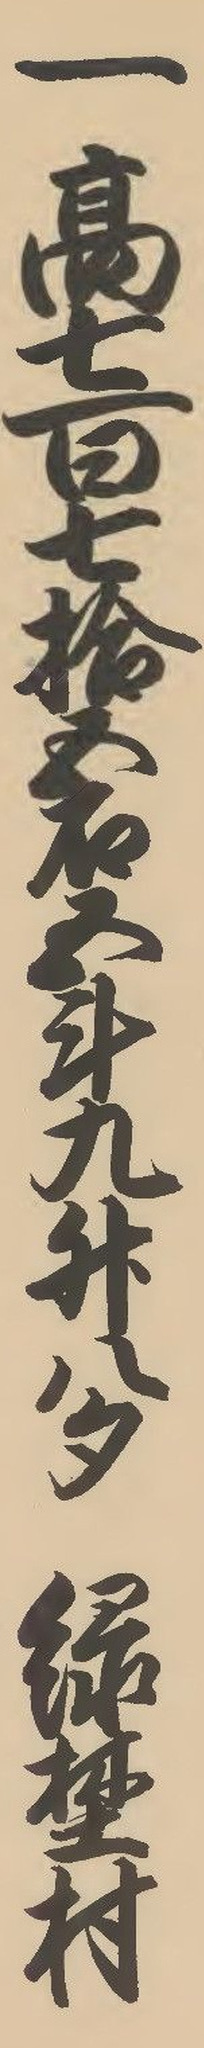一髙七百七拾五石五斗九升八夕緑埜村
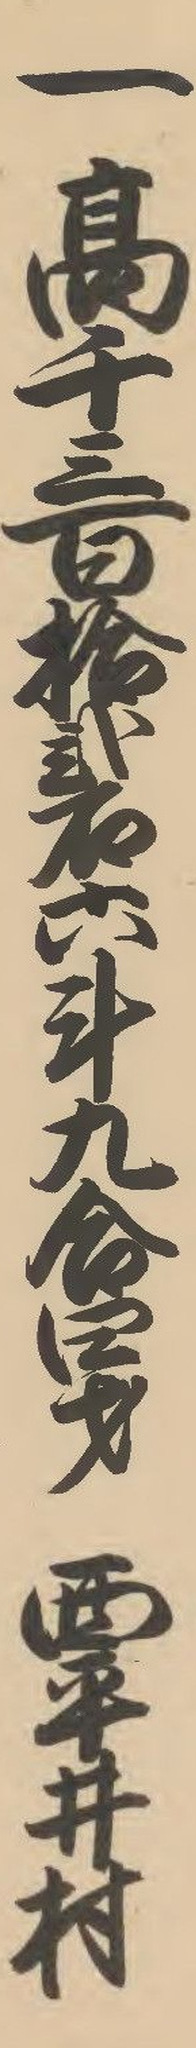一髙千三百拾弐石六斗九合四才西平井村
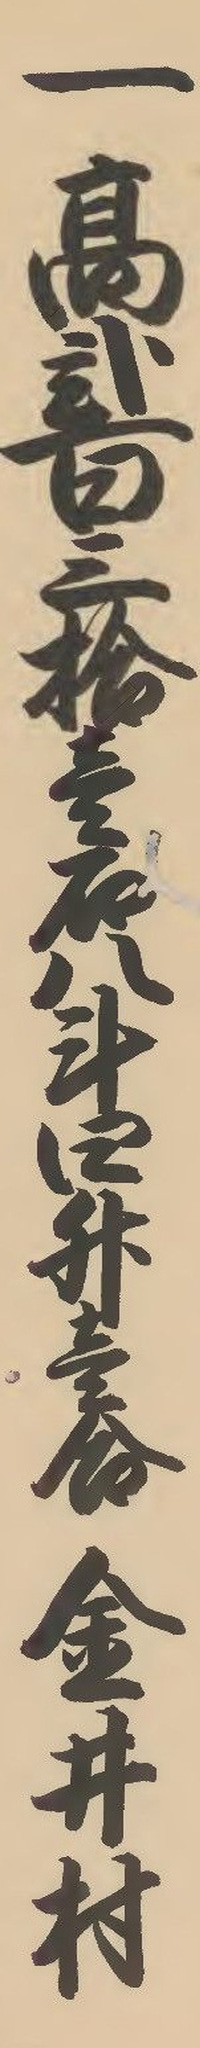一髙弐百三拾壱石八斗四升壱合金井村
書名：上野国郷帳
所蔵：国立公文書館 National Archives of Japan
